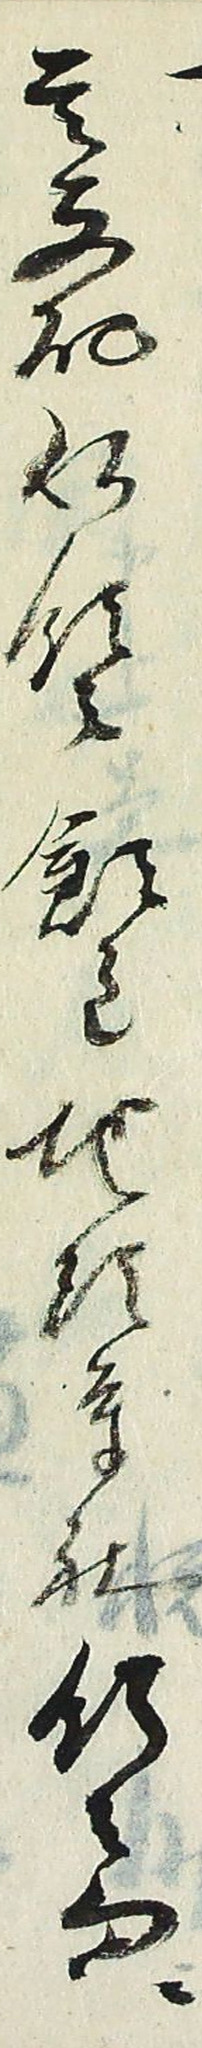其支配私領者領主地頭寺社領之向に
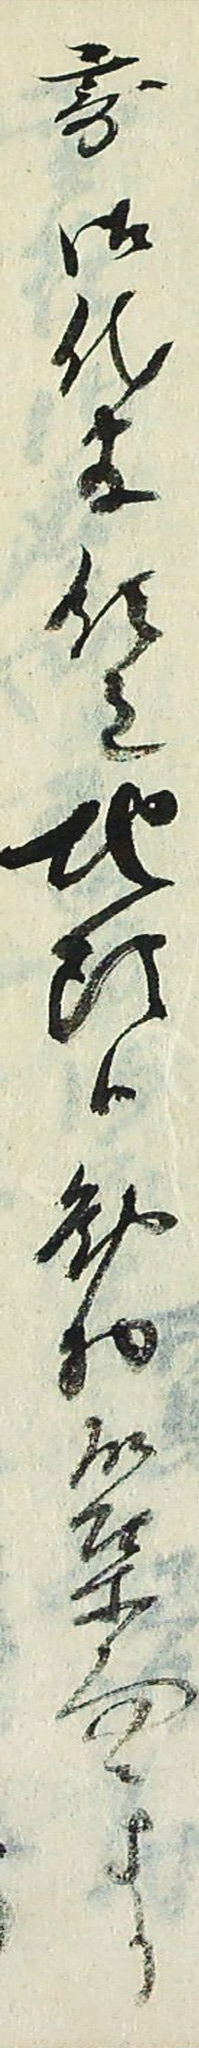寄御代官領主地頭者勧物取集向により
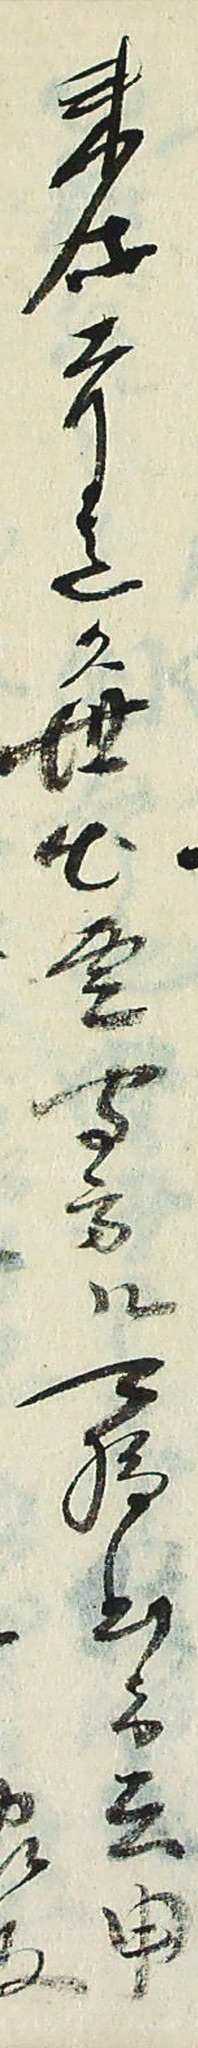来戌十一月迄久世出雲守方江可指出旨去申
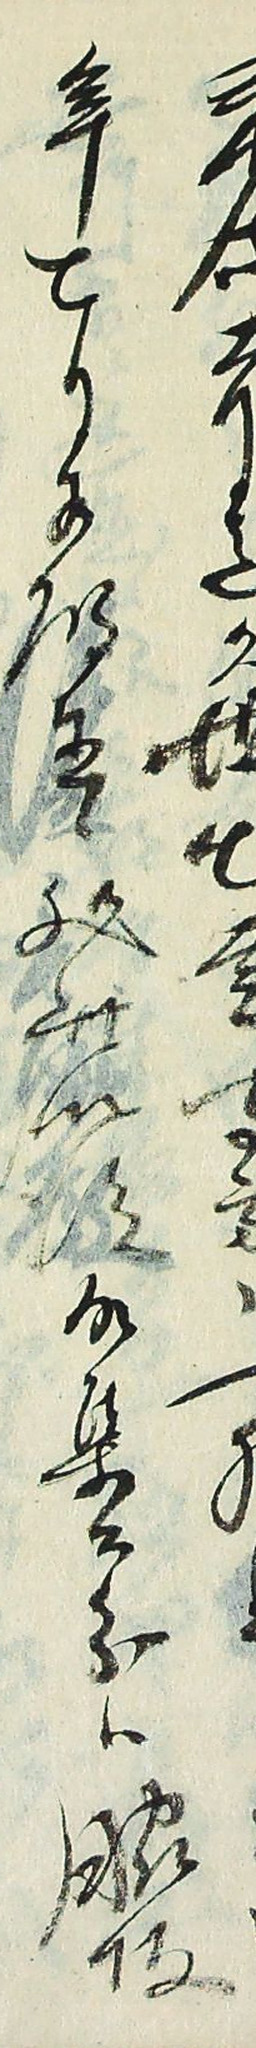年七月相触置候処此以後取集候分ハ脇坂
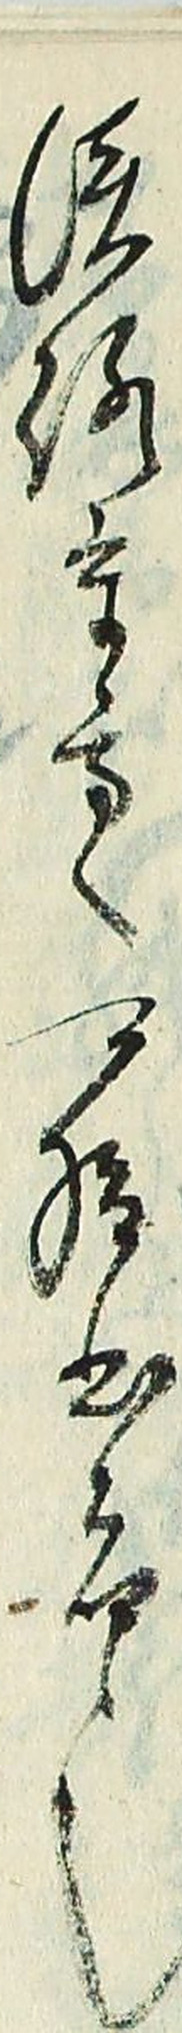淡路守方へ可指出候以上
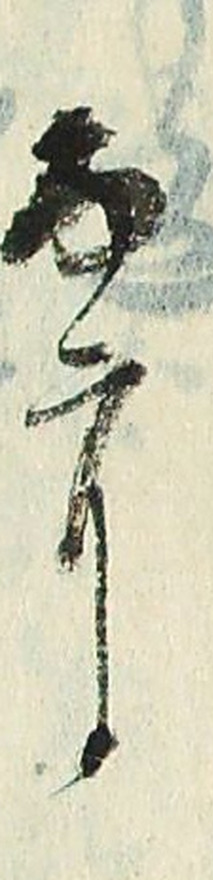酉二月
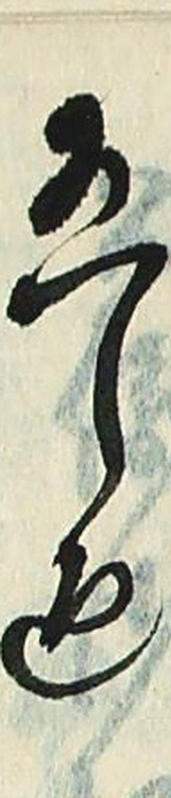右之通
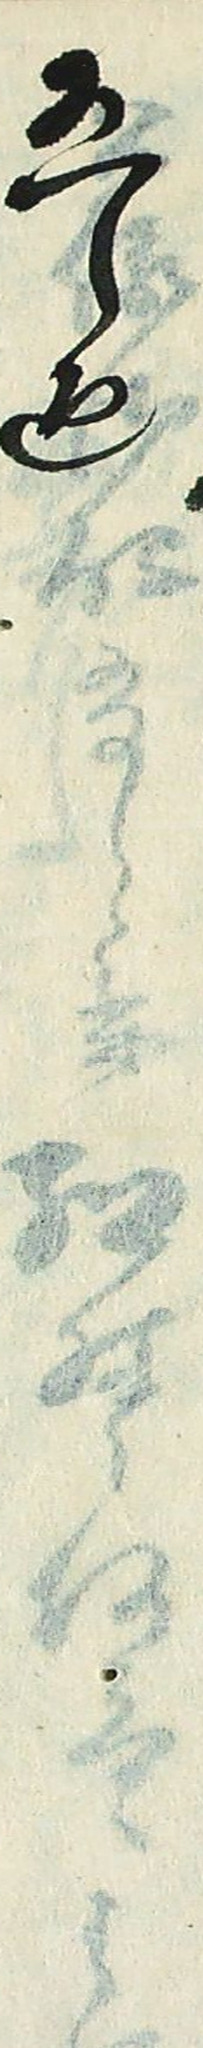右之通
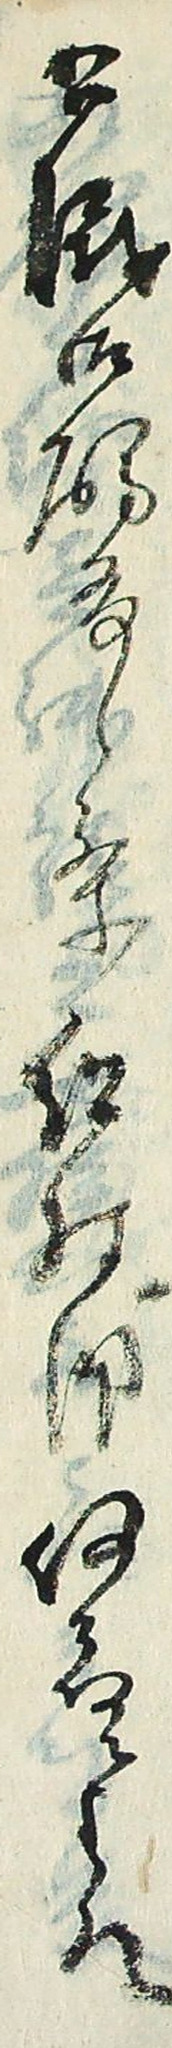右儀御触有之候条組村浦何者によらす

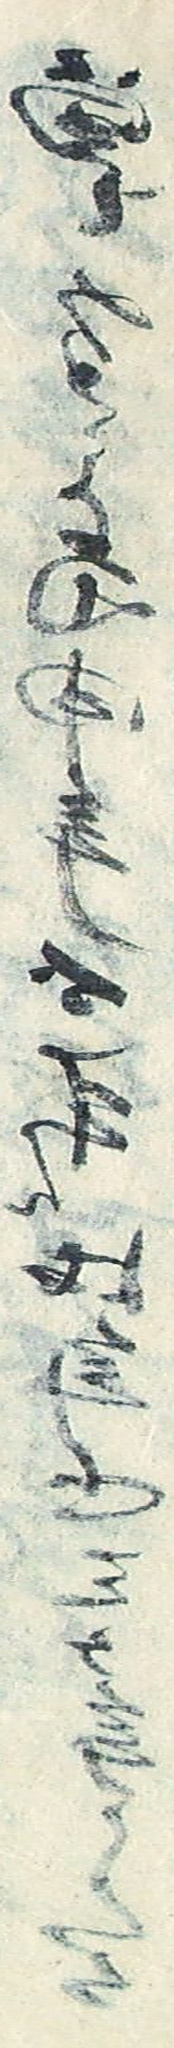酉五月十一日
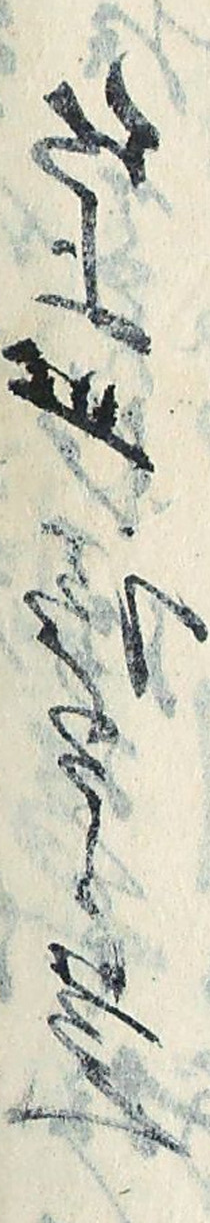酉五月十一日
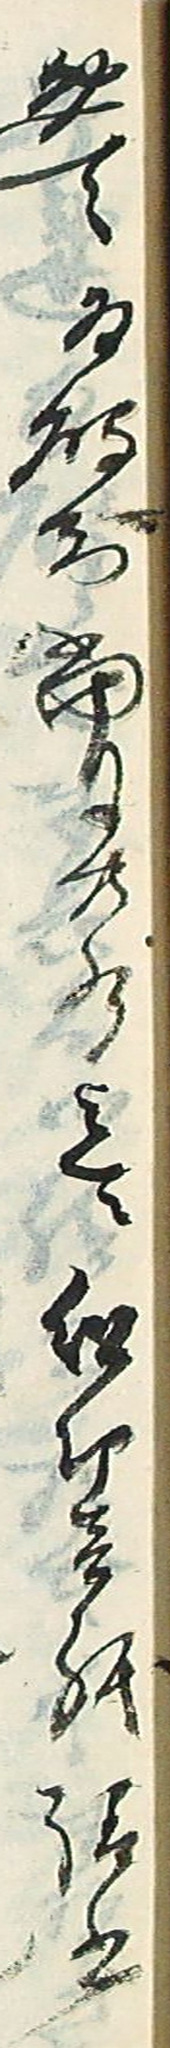逸々為触知当月廿九日迄に組切壱紙請書
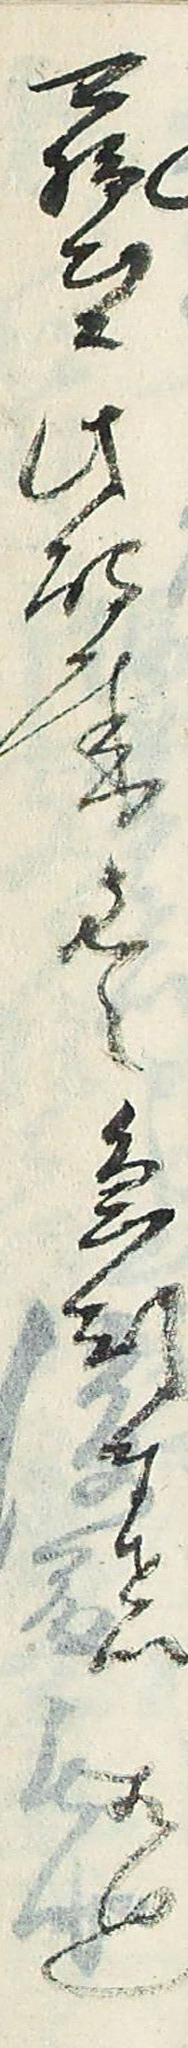可指出候此触書先々急刻付を以相廻
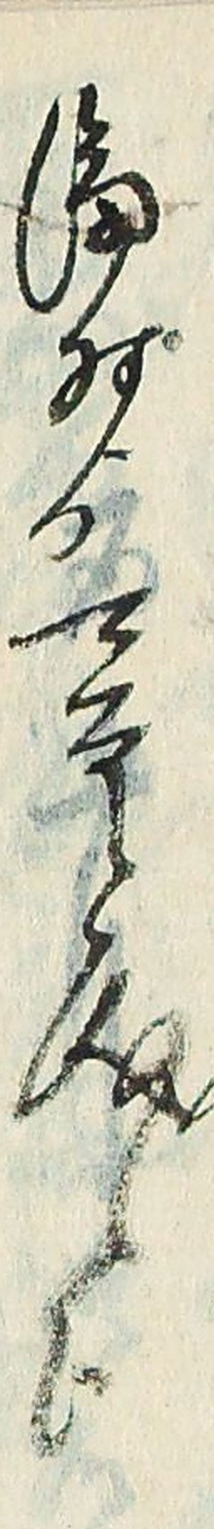済村ゟ可差戻候以上
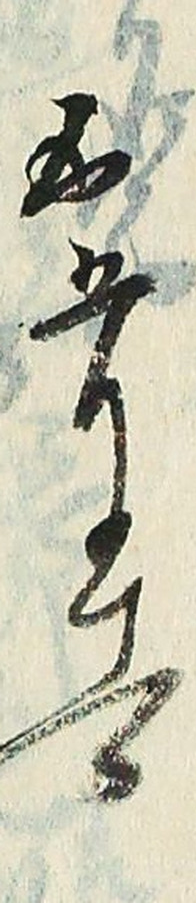酉五月十一日
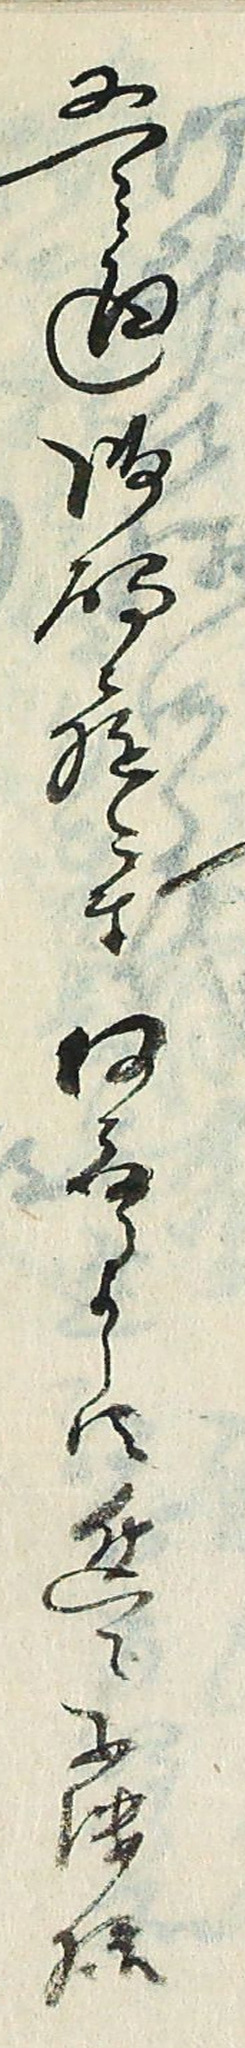右之通御触被遊候に付何者によらす逸々不洩様
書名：諸御用御□受書控
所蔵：鳴門教育大学 Naruto University of Education
